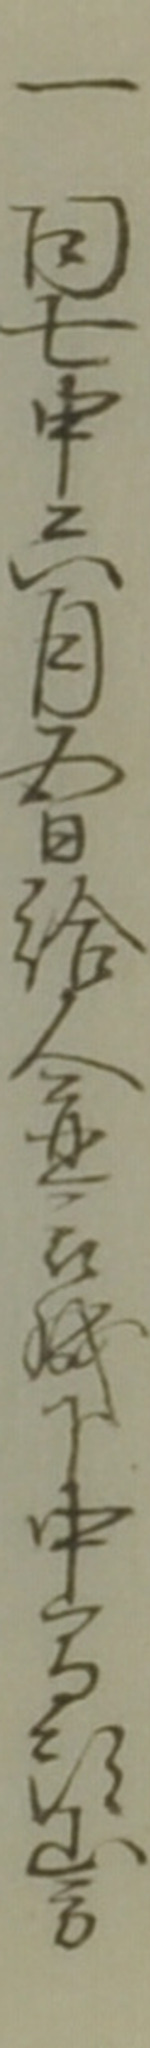一同七申六月五日給人並被成下中間頭山方
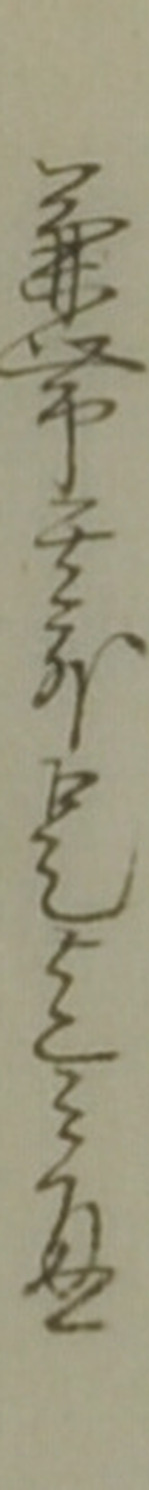兼帯其外是迄之通
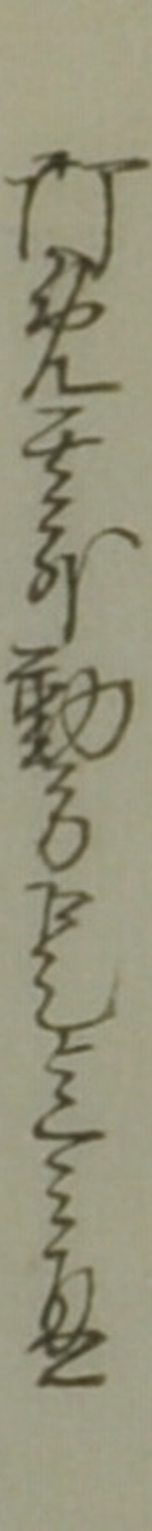御免其外勤方是迄之通
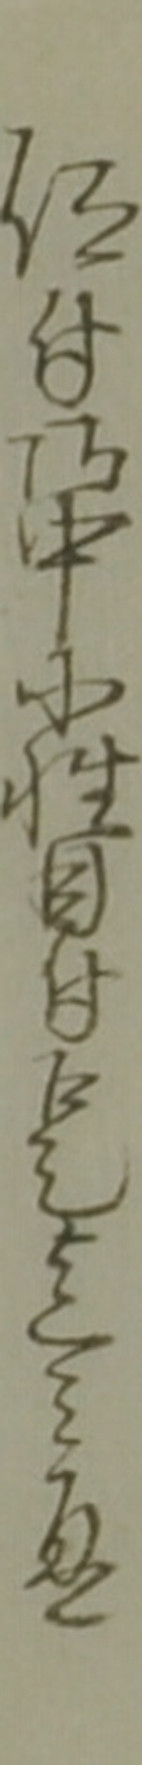仰付御中小性目付是迄之通
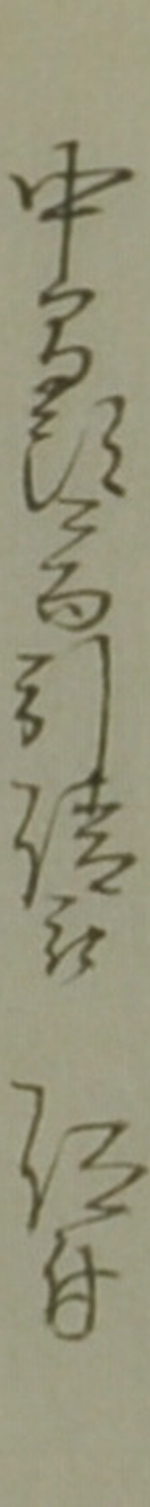中間頭ニ而引請被仰付
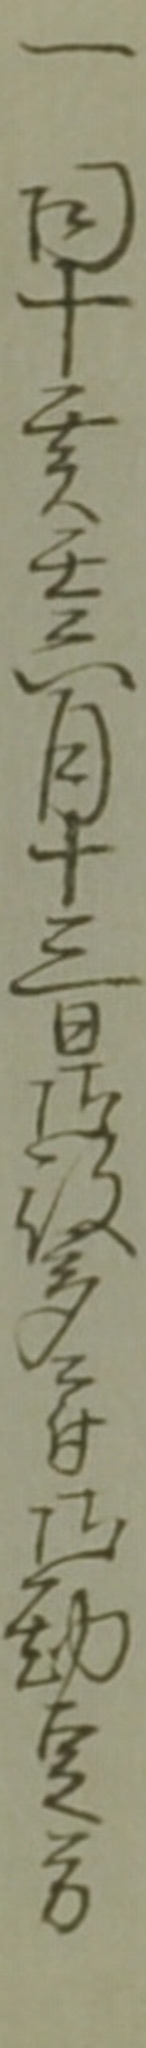一同十亥閏六月十三日御役多ニ付御勘定方
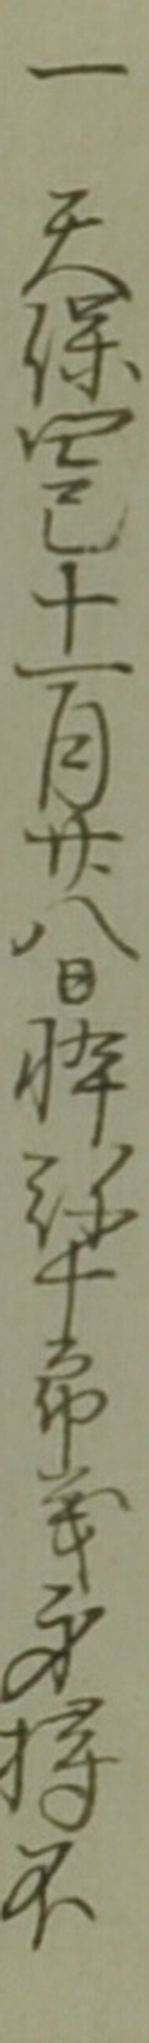一天保四巳十一月廿八日忰弥十郎義身持不
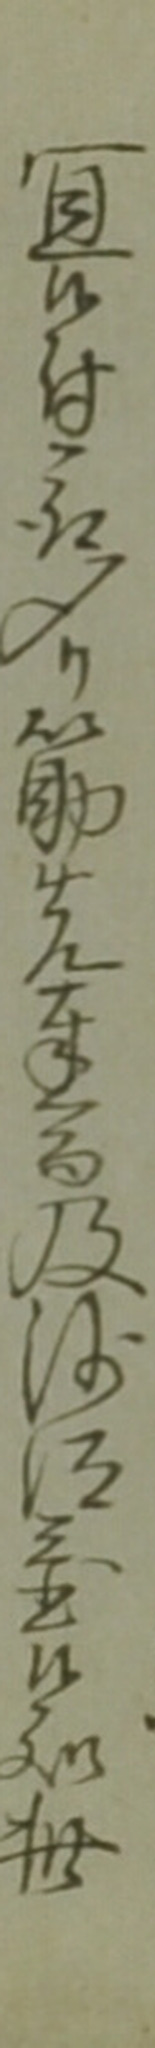宜候付取〆リ筋先達而及沙汰置候処此
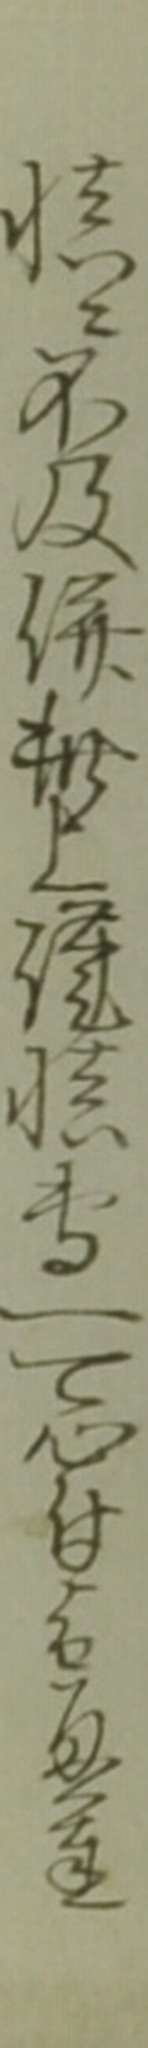慎ニ不及併此上謹慎専一可心付旨通達
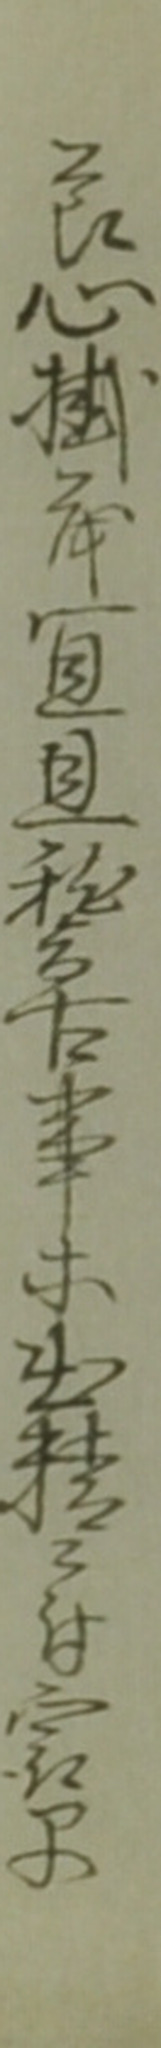節心掛茂宜且稽古事等出精ニ付最早
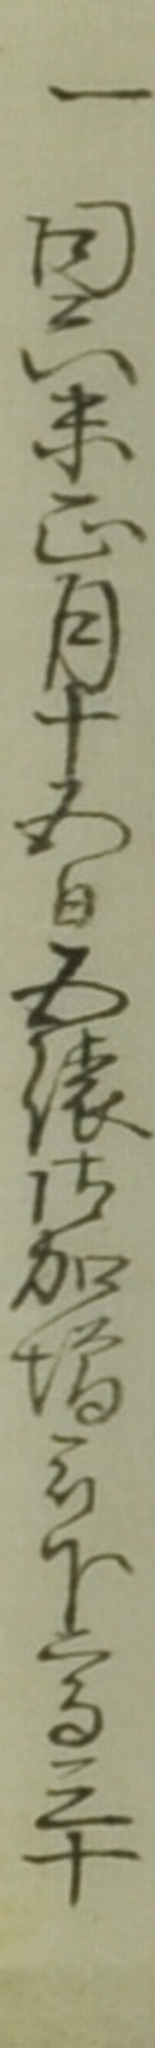一同六未正月十五日五俵御加増被下高三十

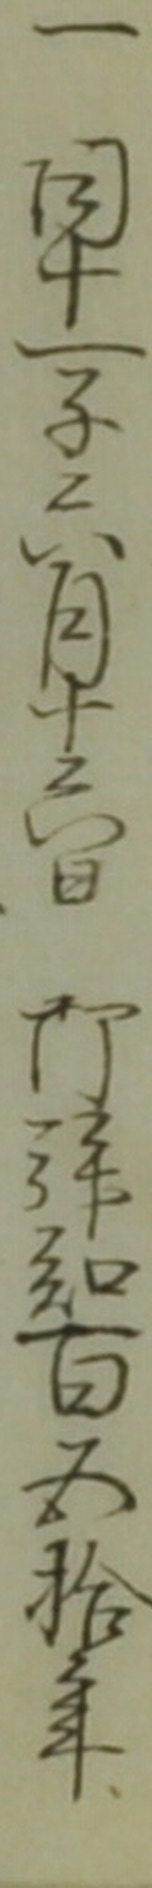一同十一子六月十六日御拝知百五拾年
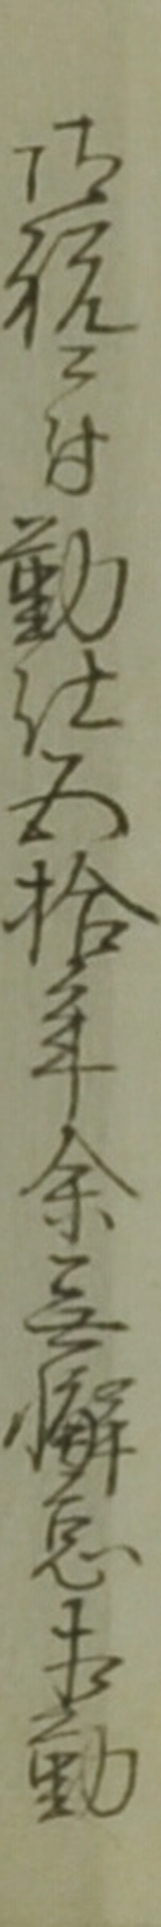御祝ニ付勤仕五拾年余無懈怠相勤
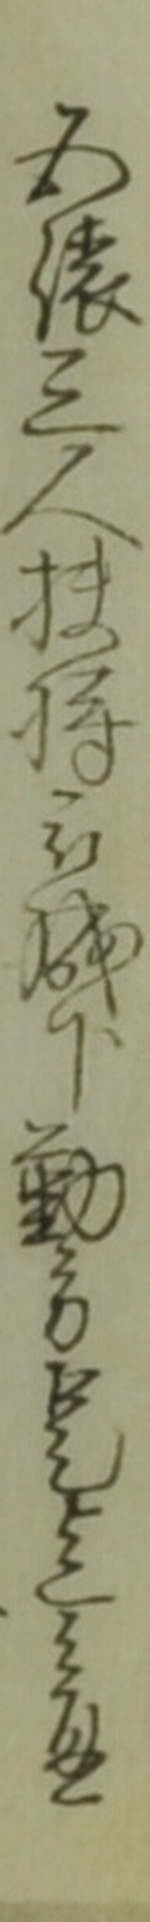五俵三人扶持被成下勤方是迄之通
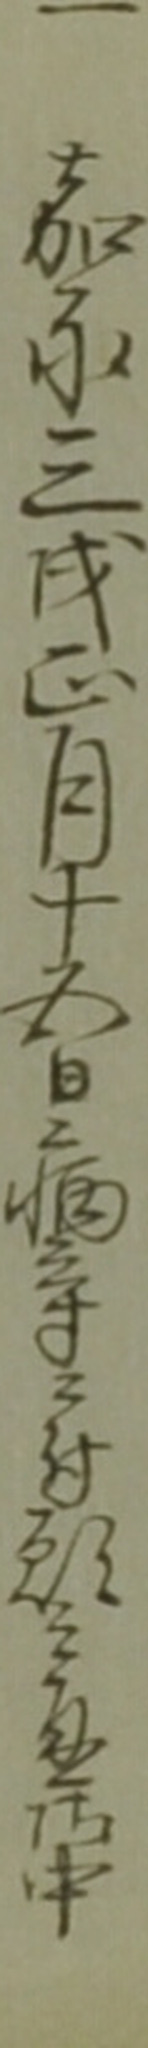一嘉永三戌正月十五日病気ニ付願之通御中
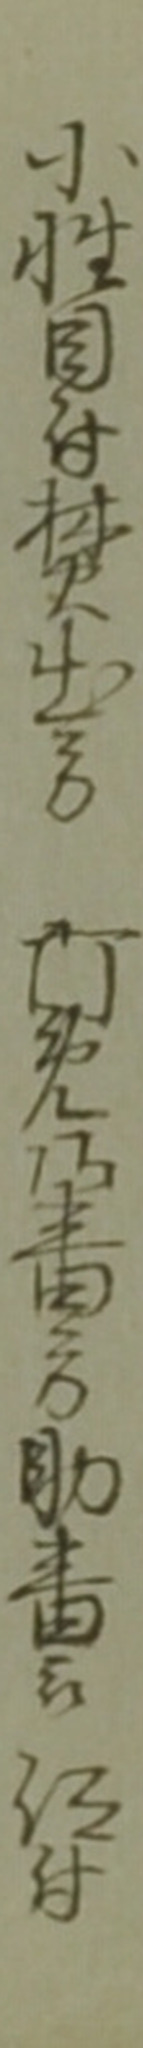小性目付焚出方御免御番方助番被仰付
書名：無足諸士勤仕録（一）
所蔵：伊那市立高遠町図書館・合同会社AMANE
